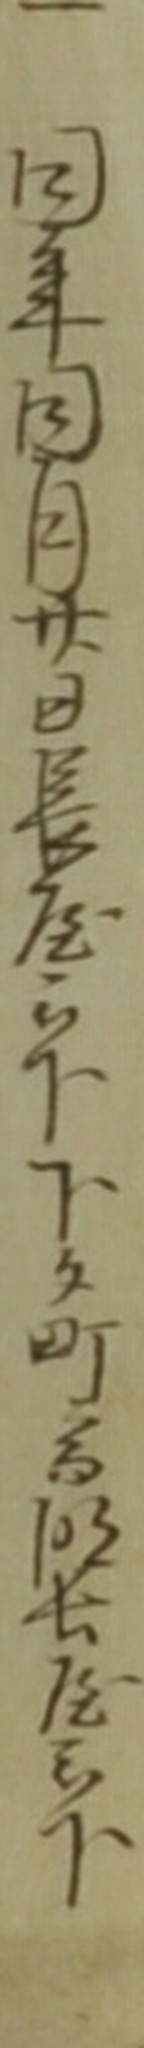一同年同月廿日長屋被下下タ町ニ而明長屋被下
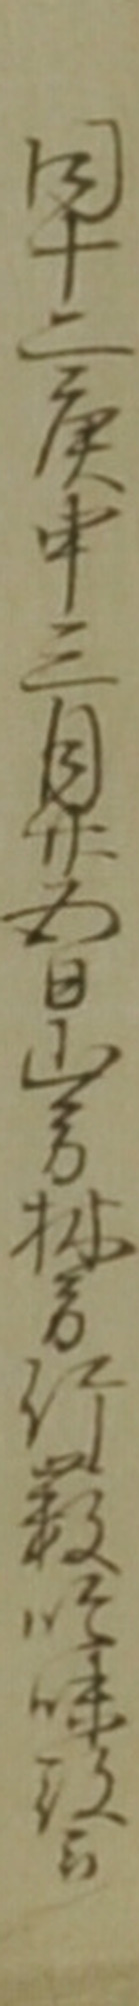一同十二庚申三月廿五日山方林方竹藪吟味役被
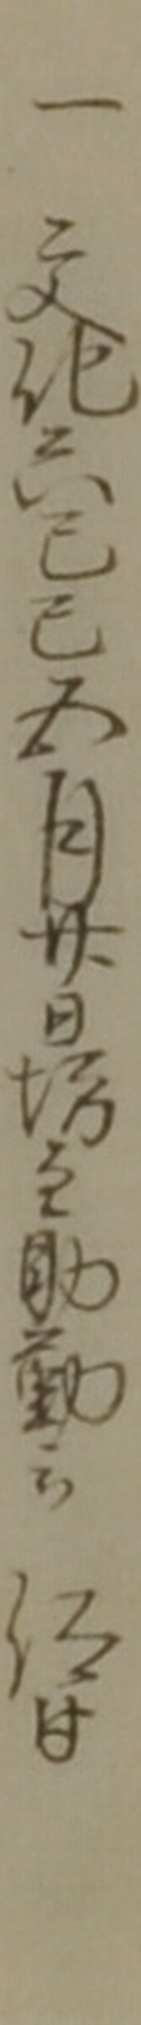一文化六己巳五月廿日坊主助勤被仰付
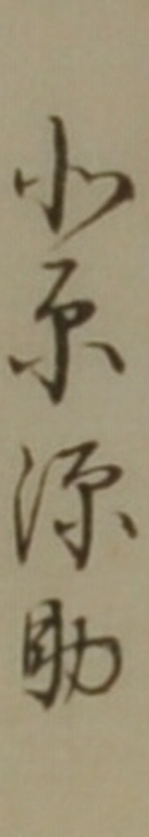北原源助
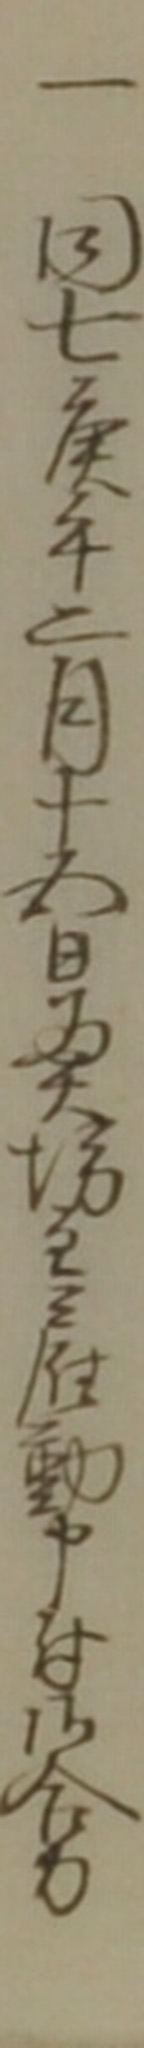一同七庚午二月十五日奥坊主雇勤申付御合力
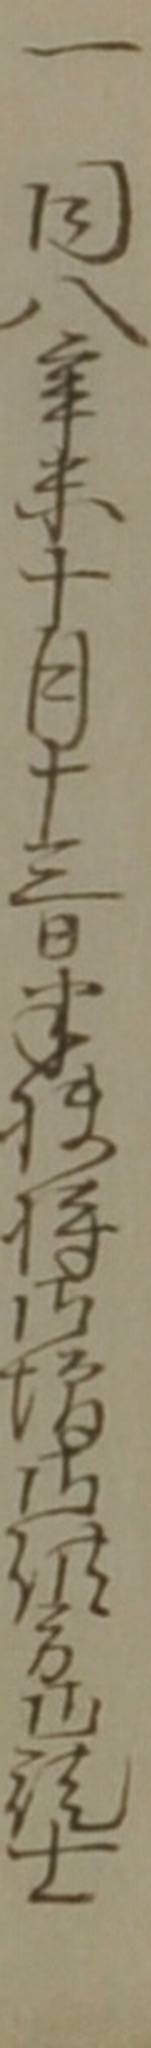一同八辛未十月十三日半扶持御増御供方御徒士
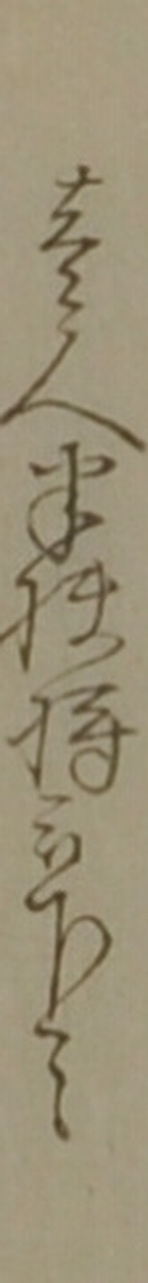壱人半扶持被下
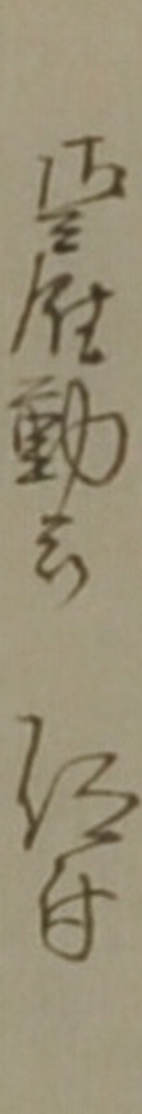御雇勤被仰付
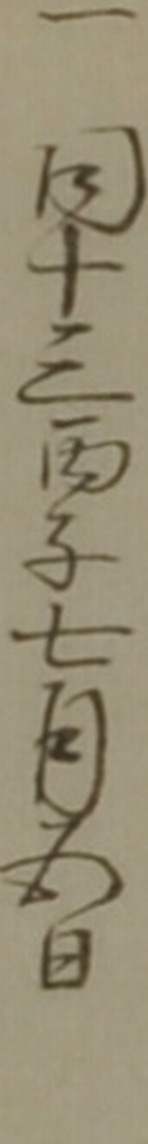一同十三丙子七月五日
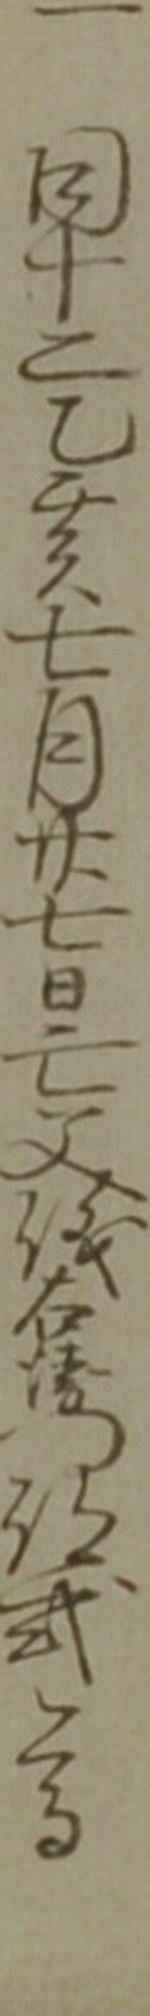一同十二乙亥七月廿七日亡父儀右衛門役式高
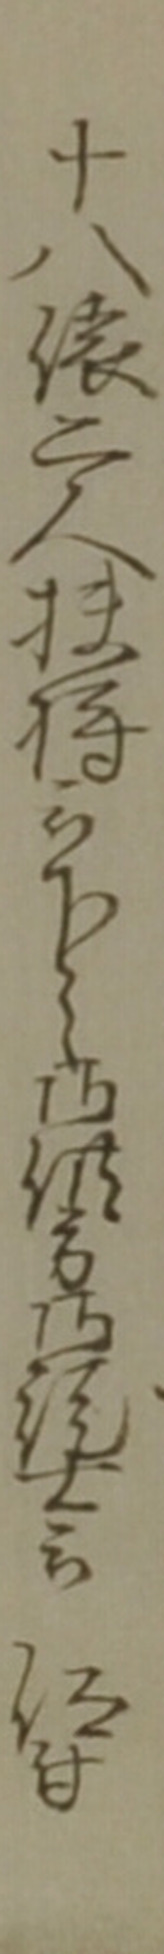十八俵二人扶持被下候御供方御徒士被仰付
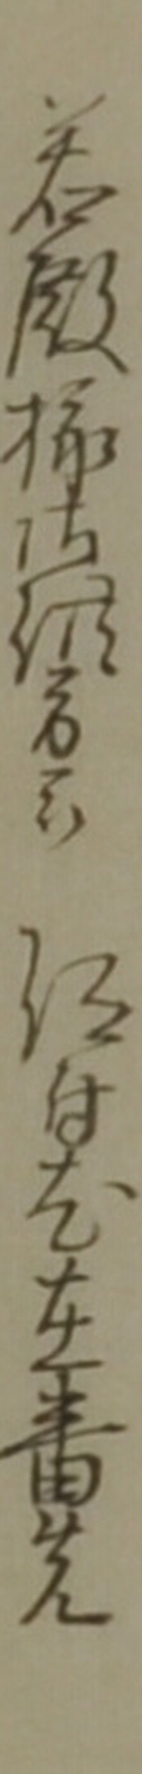若殿様御供方被仰付尤在番先

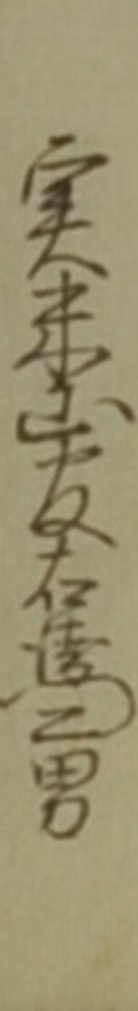実米山官右衛門二男
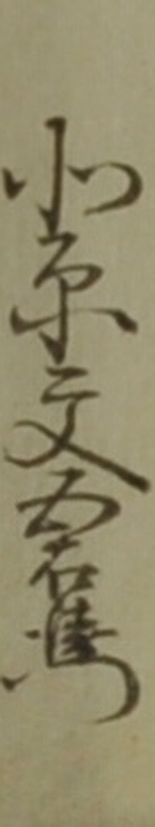北原文五右衛門
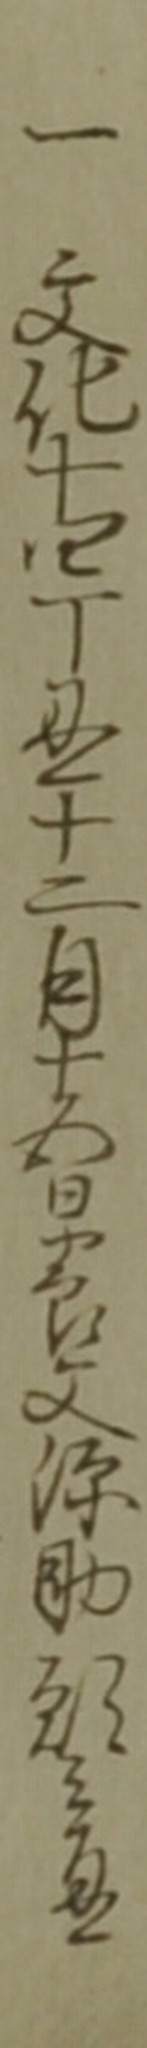一文化十四丁丑十二月十五日養父源助願之通
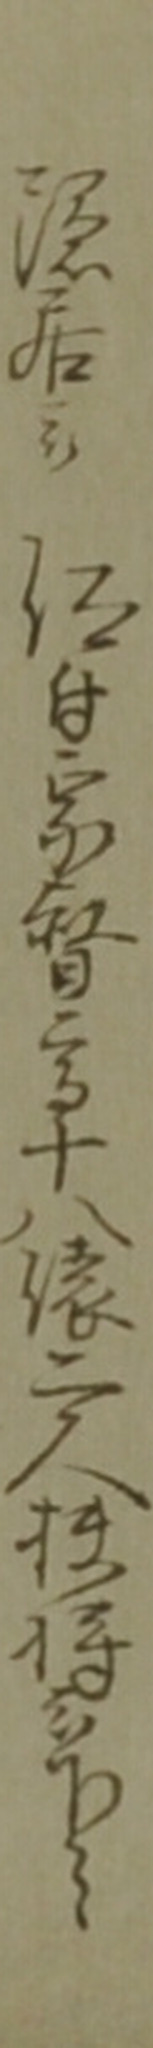隠居被仰付家督高十八俵二人扶持被下之
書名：無足諸士勤仕録（六）
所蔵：伊那市立高遠町図書館・合同会社AMANE
